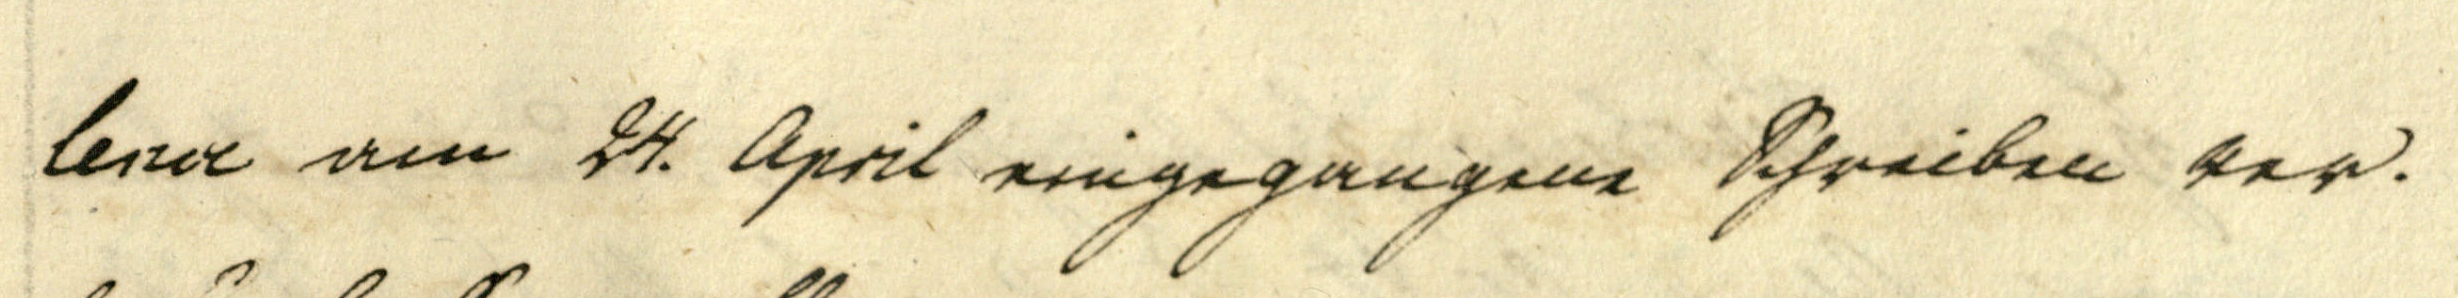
lence am 24. April eingegangene Schreiben ver¬
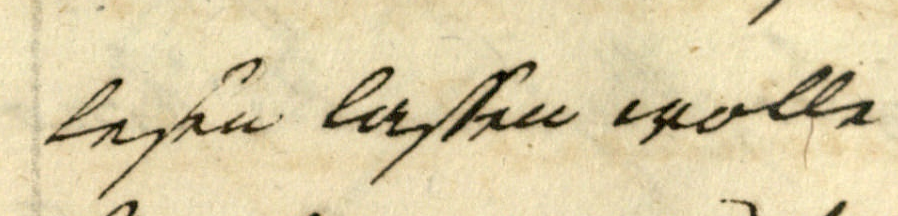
lesen lassen wolle.
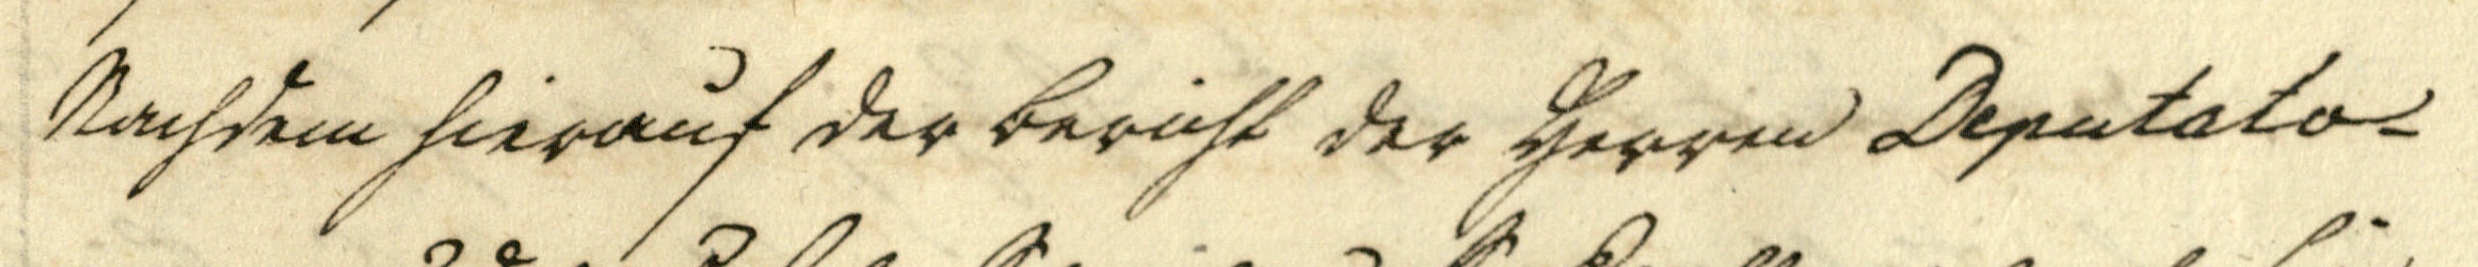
Nachdem hierauf der Bericht der Herren Deputato¬
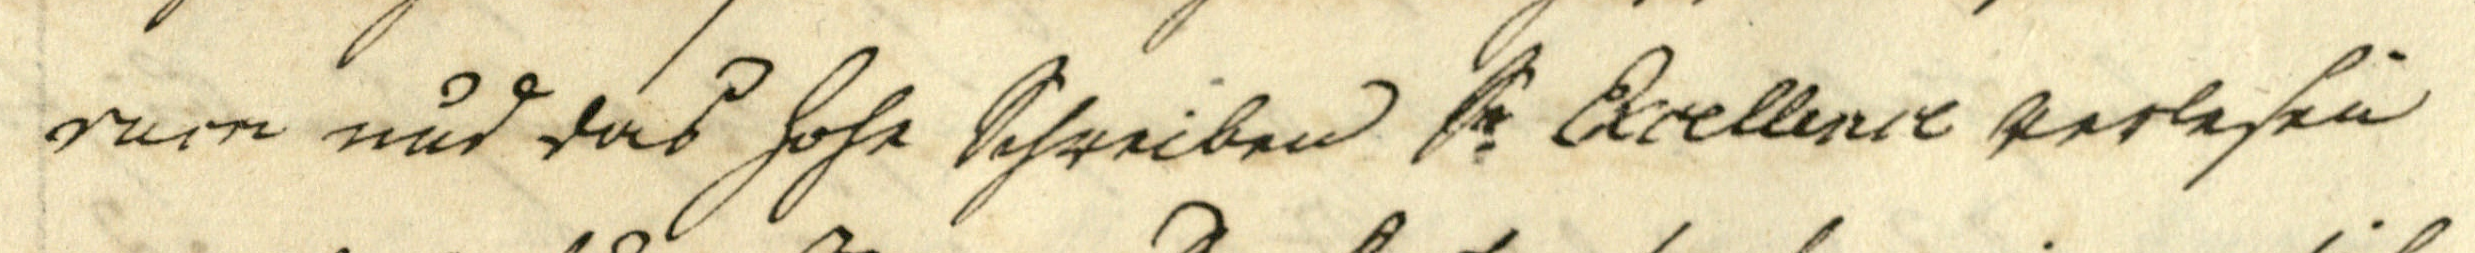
rum und das hohe Schreiben Sr Excellence verlesen
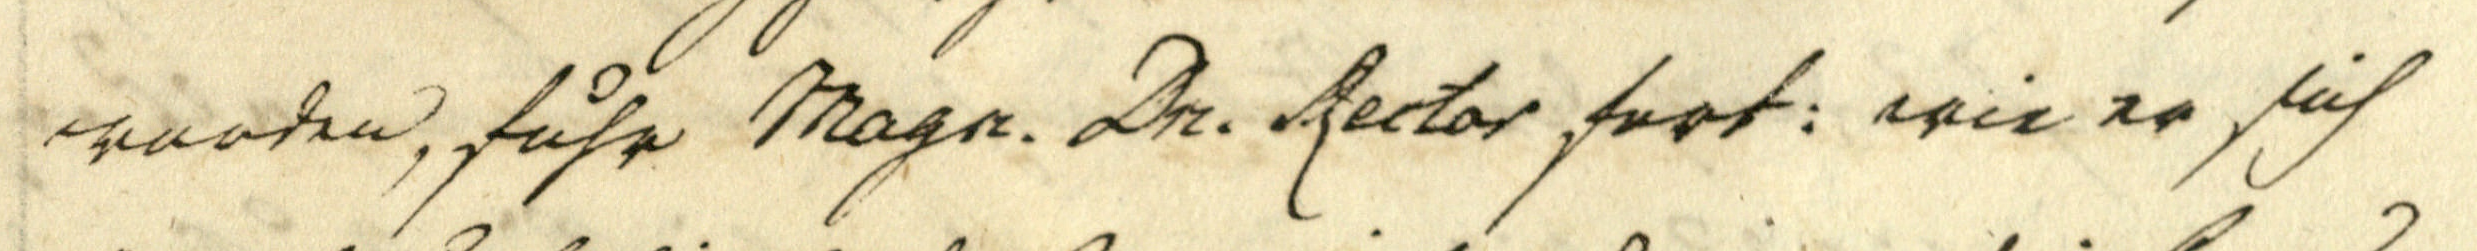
worden, fuhr Magn. Dn. Rector fort: wie er sich
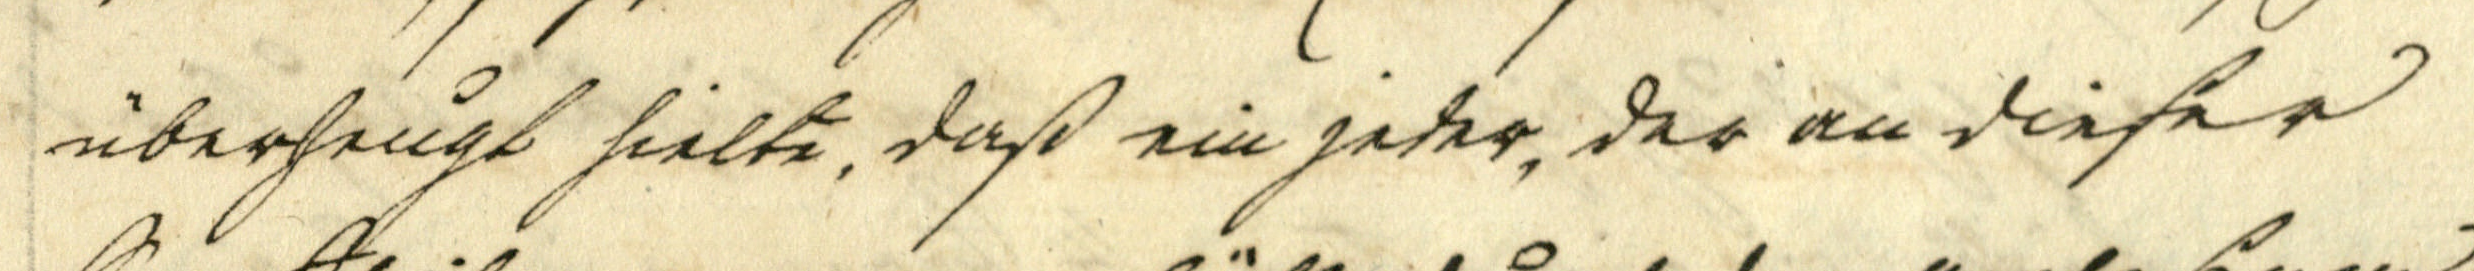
überzeugt hielte, daß ein jeder, der an dieser
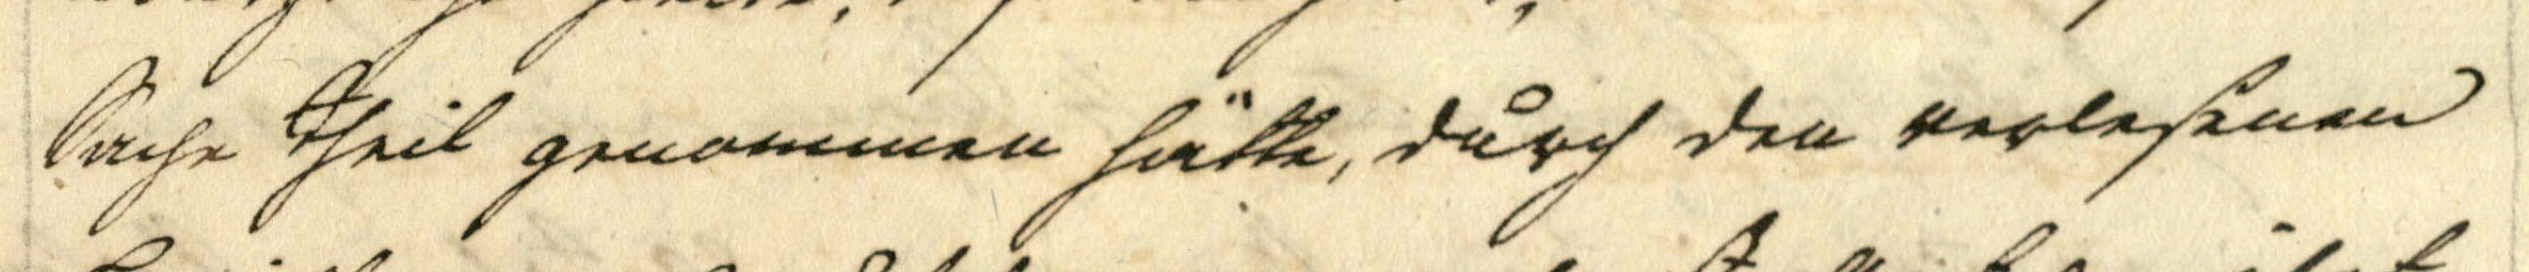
Sache Theil genommen hätte, durch den verlesenen
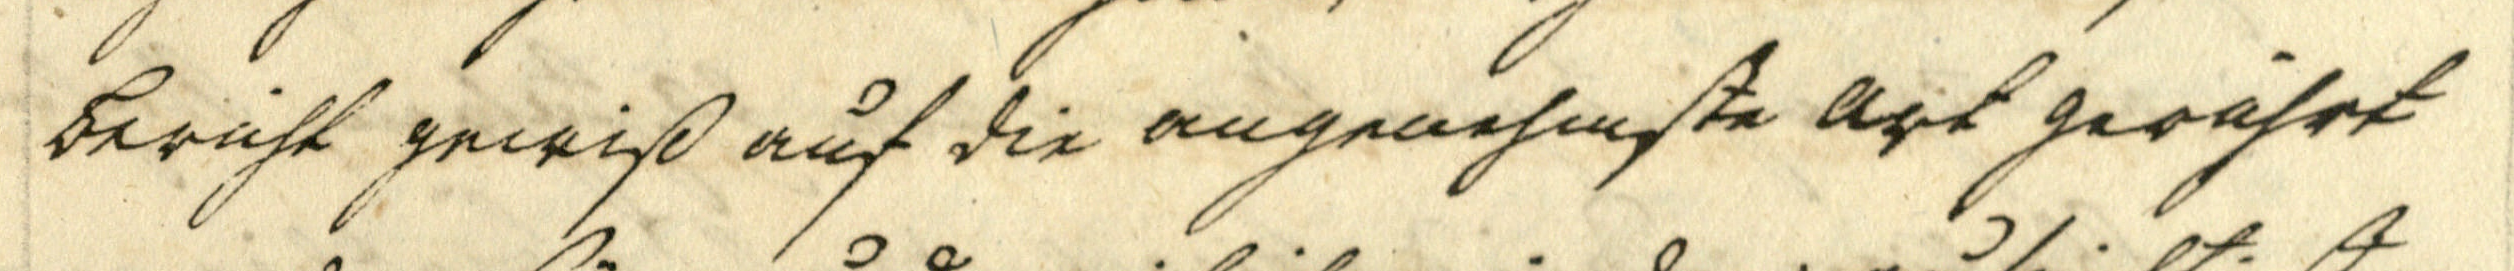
Bericht gewiß auf die angenehmste Art gerührt
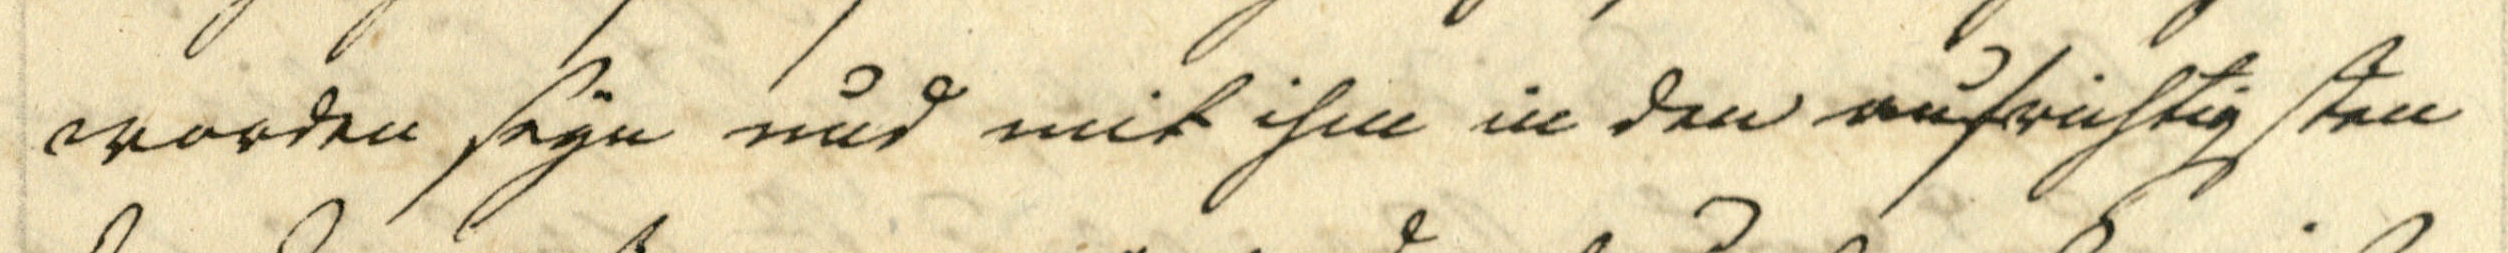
worden seÿn und mit ihm in den aufrichtigsten
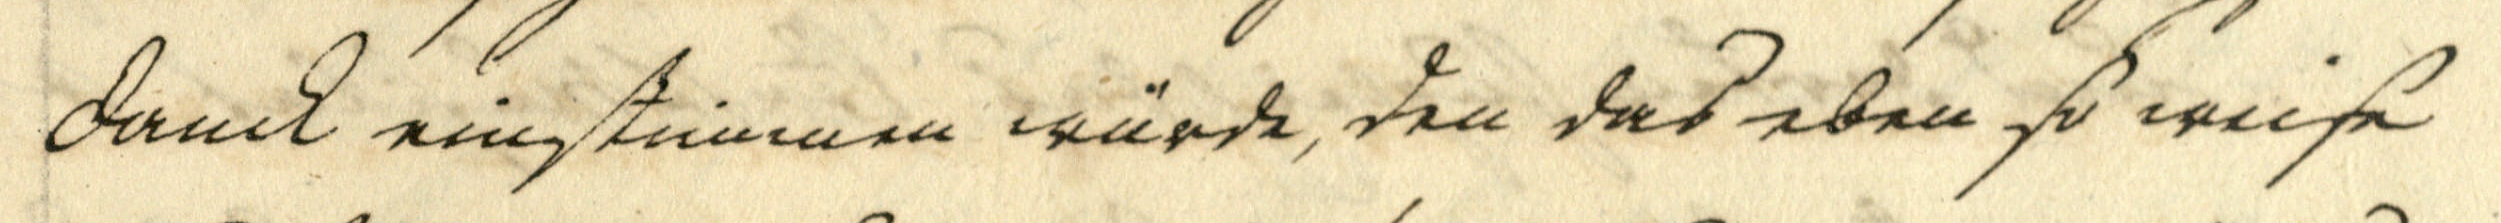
Danck einstimmen würde, den das eben so weise
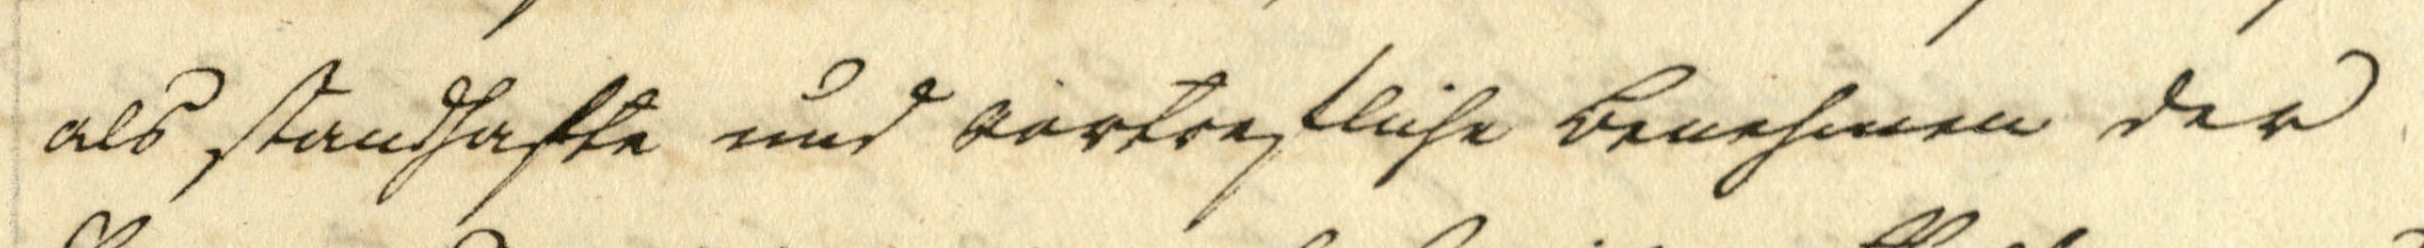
als standhafte und vortrefliche Benehmen der
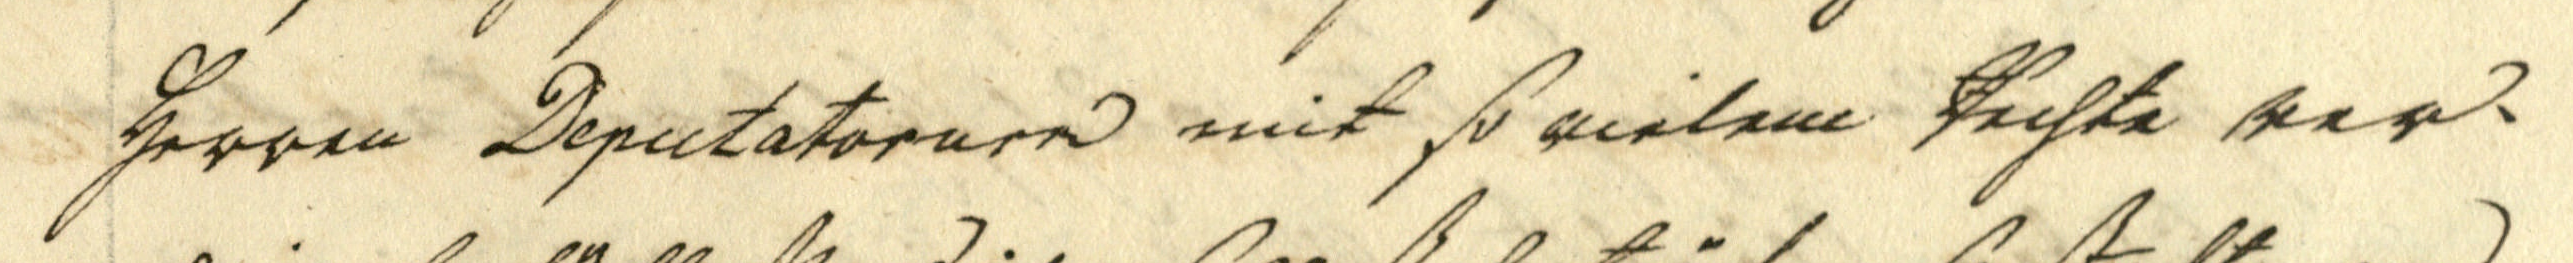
Herren Deputatorum mit so vielem Rechte ver¬
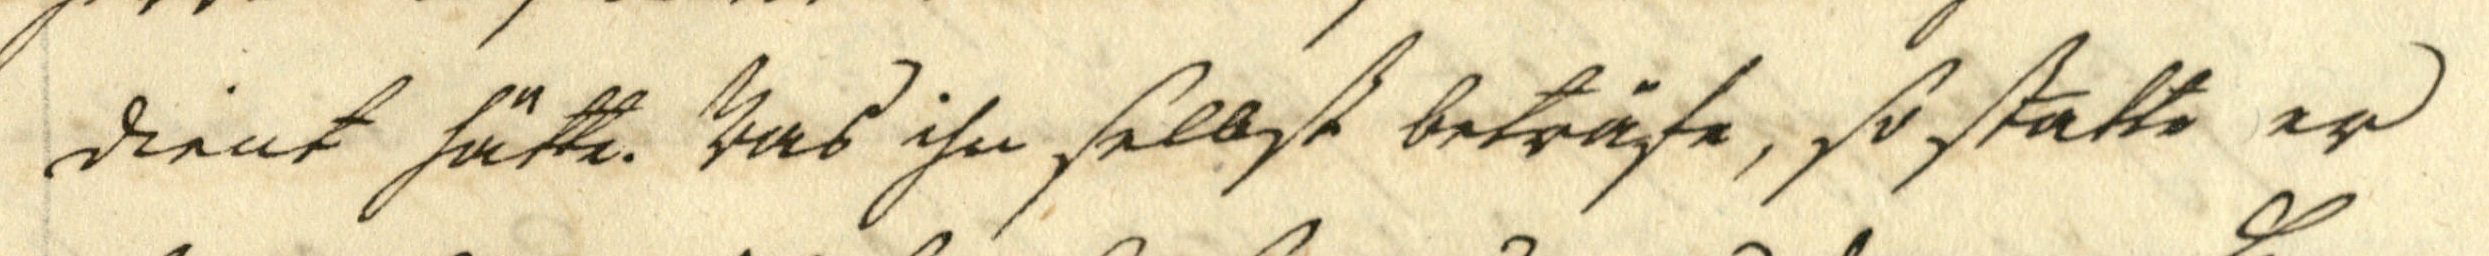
dient hätte. Was ihn selbst beträfe, so statte er
